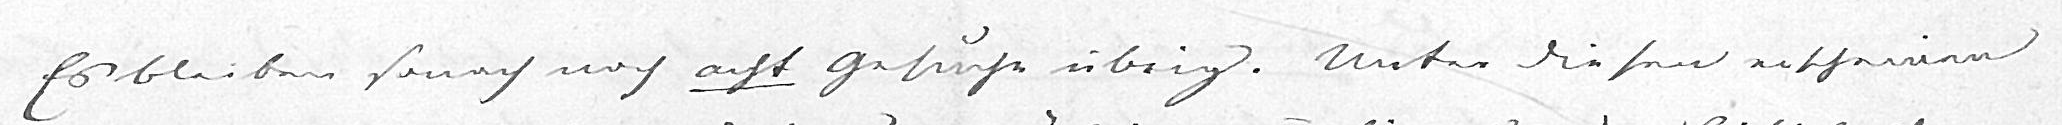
Es bleiben sonach noch acht Gesucht übrig. Unter diesen erscheinen
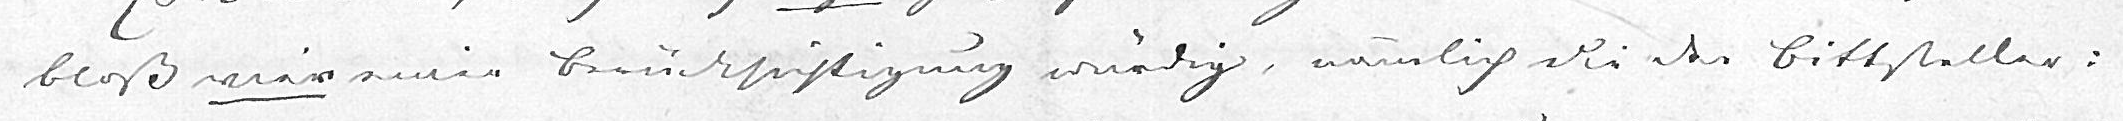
bloß vier einer Berücksichtigung würdig, nämlich die der Bittsteller:
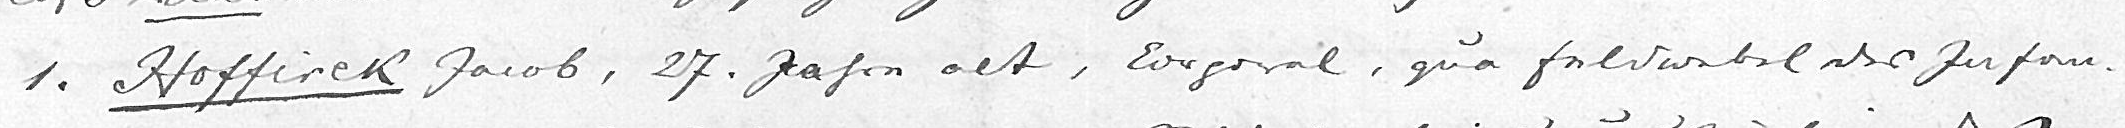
1. Hoffirek Jacob, 27 Jahre alt, Corporal, qua Feldwebel des Infan-
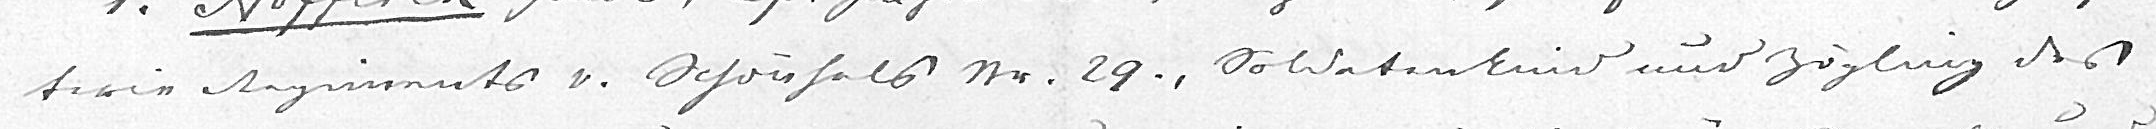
terie Regiments v. Schönfels Nr. 29., Soldatenkind und Zögling des
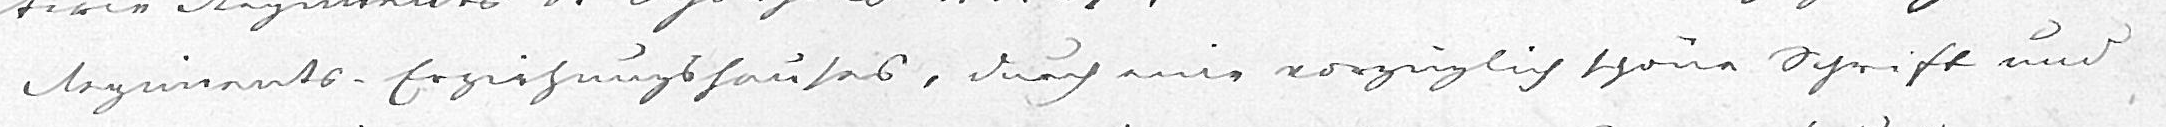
Regiments-Erziehungshauses, durch eine vorzüglich schöne Schrift und
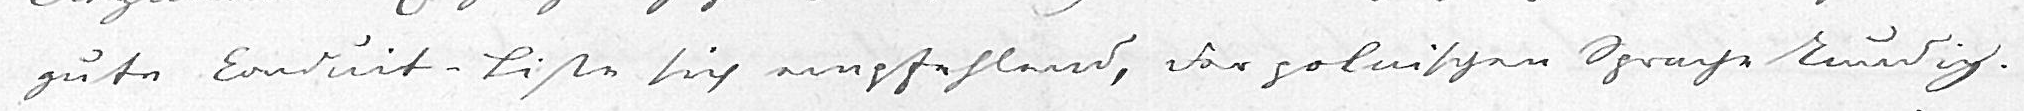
gute Conduit-Liste sich empfehlend, der polnischen Sprache kundig.
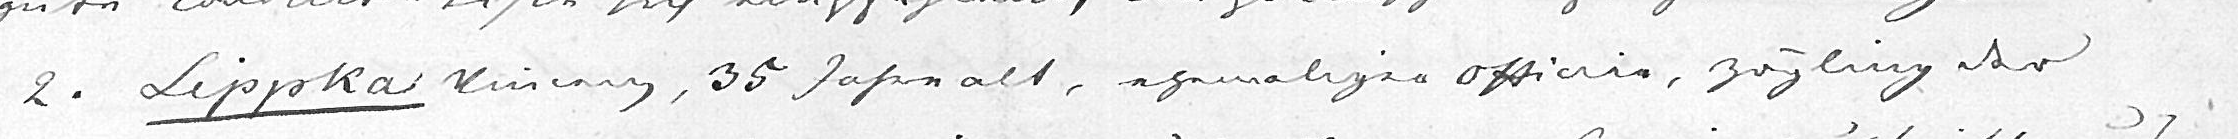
2. Lippka Vincenz, 35 Jahre alt, ehemaliger Officier, Zögling der
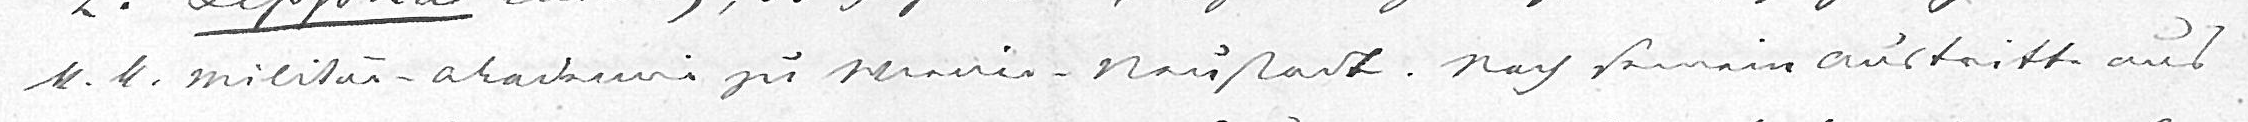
k.k. Militärakademie zu Wiener Neustadt. Nach seinem Austritt aus
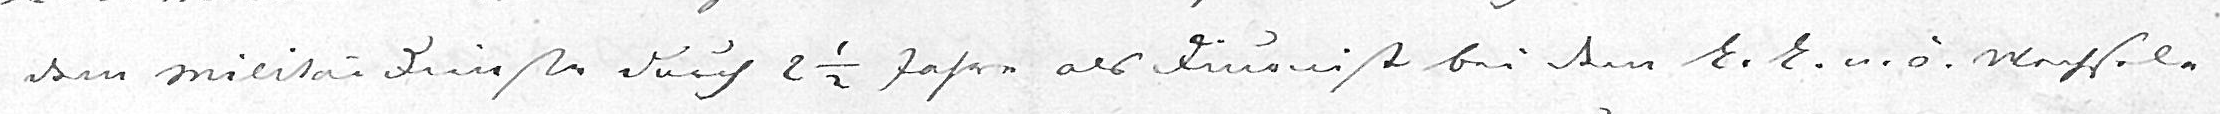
dem MilitärDienste durch 2 1/2 Jahre als Diurnist bei dem k.k. n.ö. Wechsel-
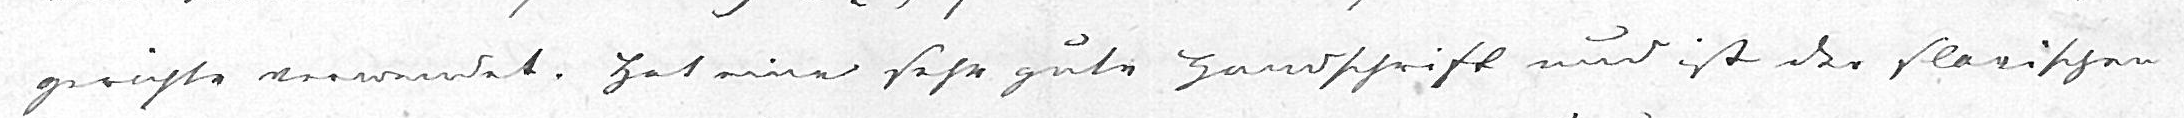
gerichte verwendet. Hat eine sehr gute Handschrift und ist der slavischen
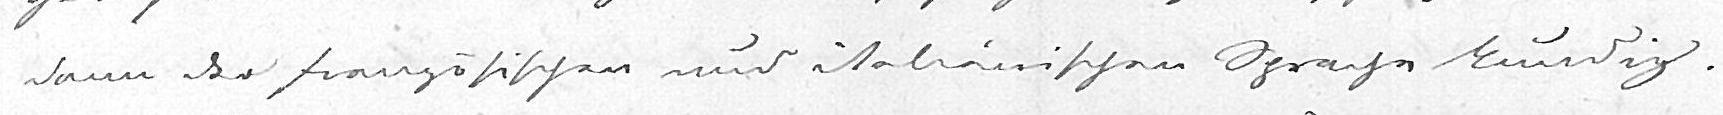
Dann der französischen und italienischen Sprache kundig.
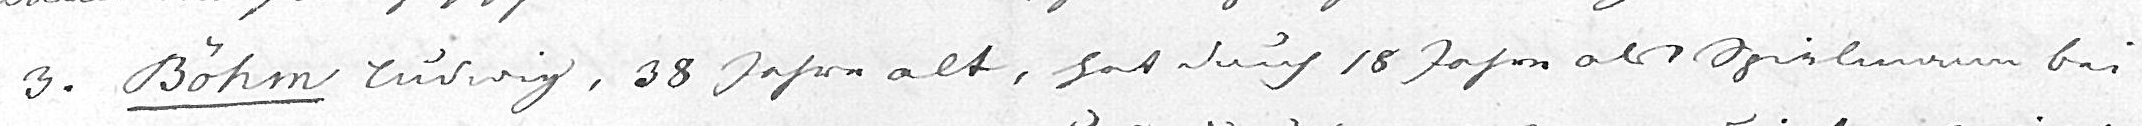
3. Böhm Ludwig, 38 Jahre alt, hat durch 18 Jahre als Spielmann bei
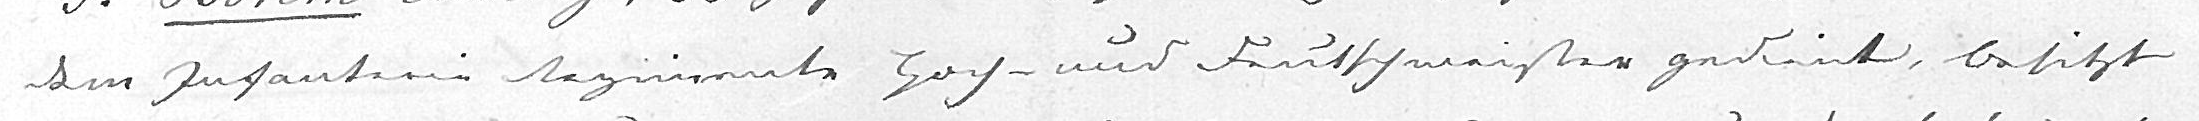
dem Infanterie Regimente Hoch- und Deutschmeister gedient, besitzt
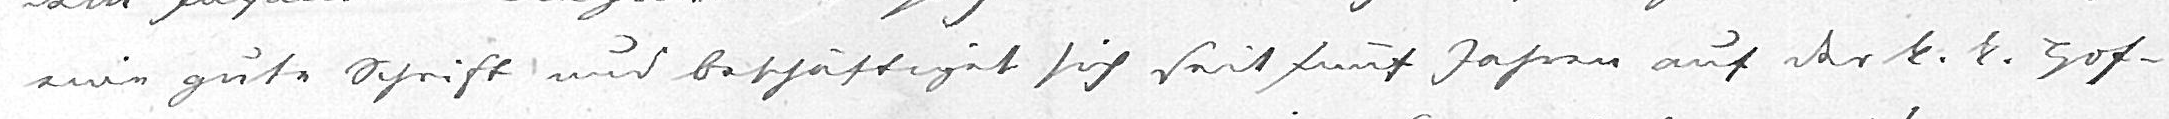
eine gute Schrift und beschäftigt sich seit fünf Jahren auf der k.k. Hof-
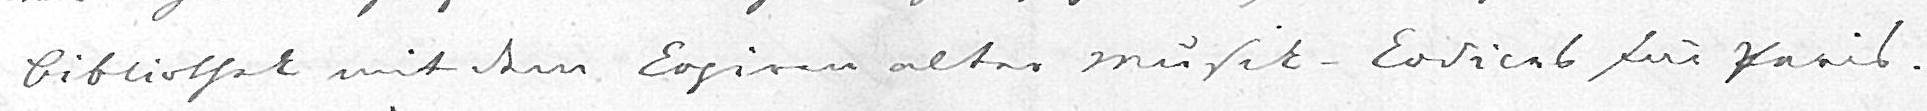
bibliothek mit dem Copiren alter Musik-Codices für Paris.
